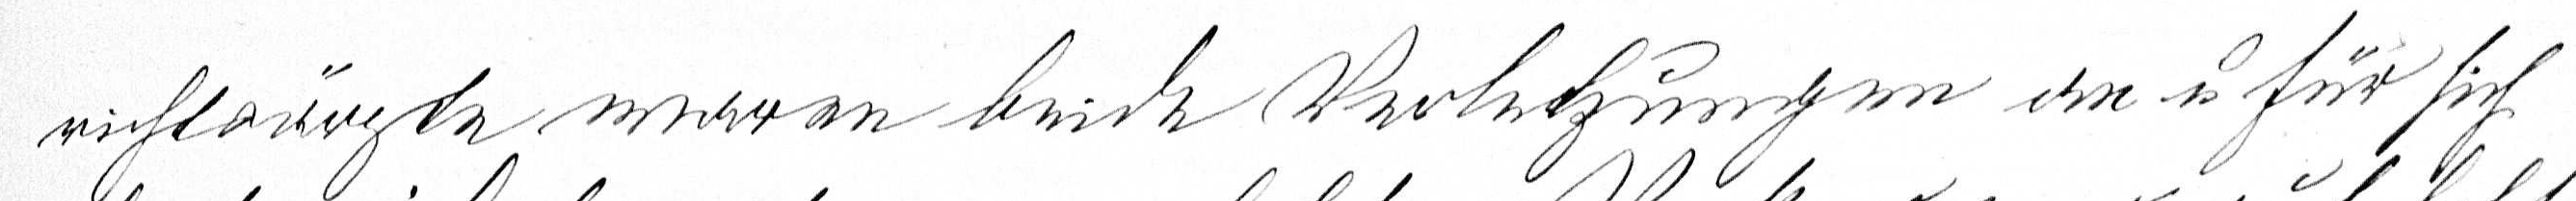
richtenärzte waren beide Verletzungen an u. für sich
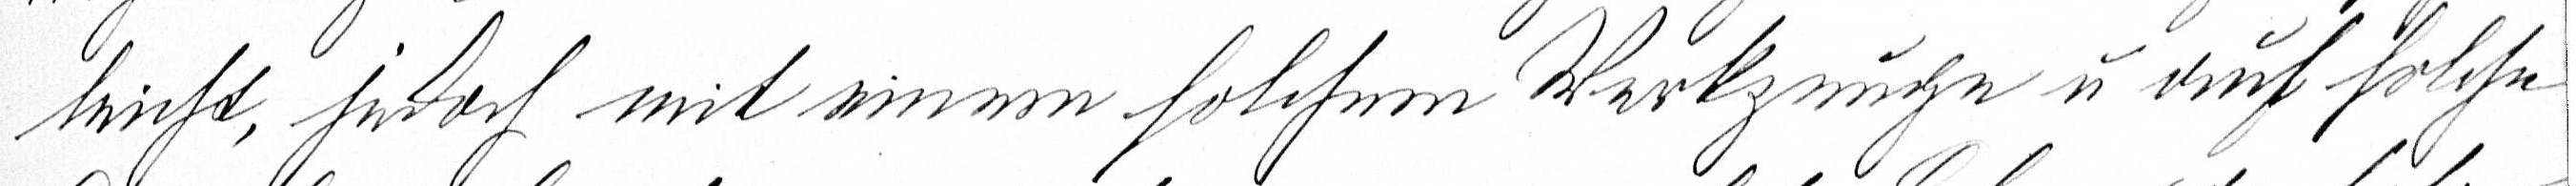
leicht, jedoch it einem solchen Werkzeuge u auch solche
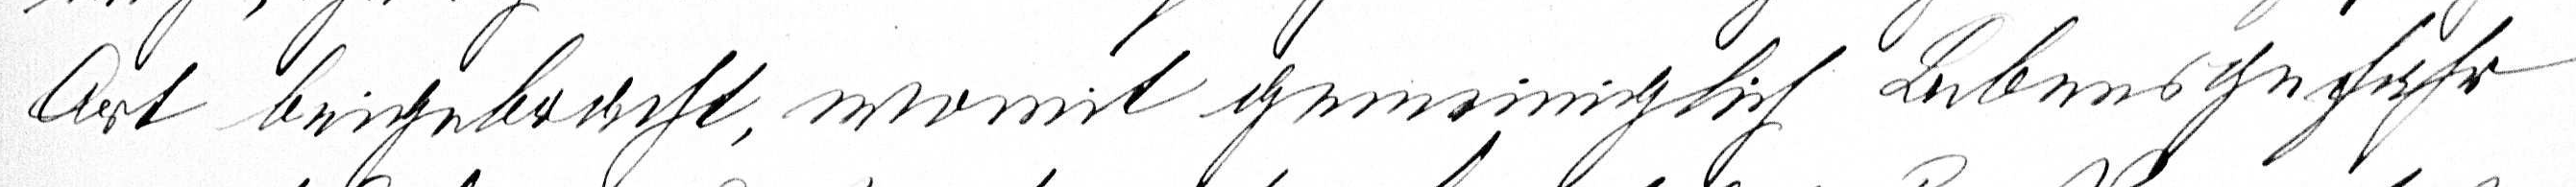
Art beigebracht, womit gemeiniglich Lebensgefahr
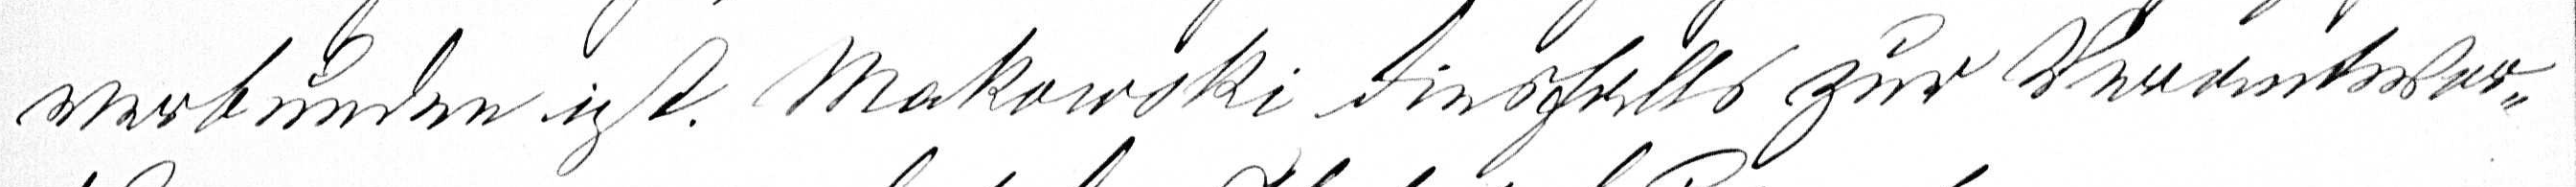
verbunden ist. Makowski diesfalls zur Verantwor¬
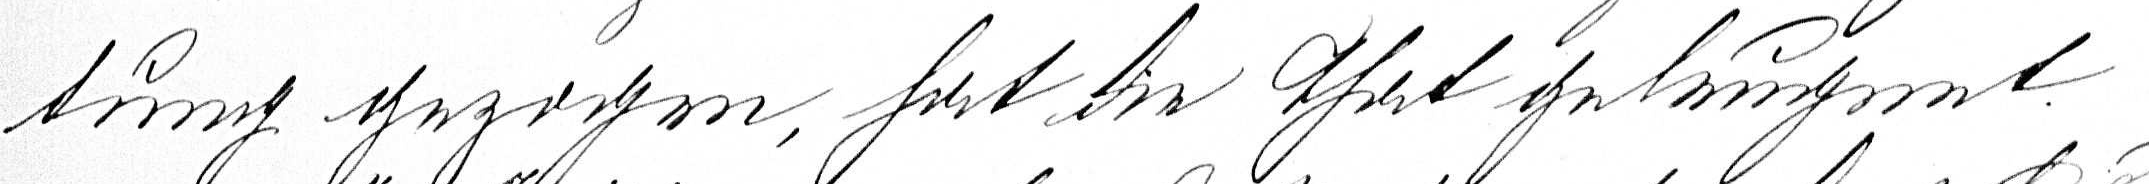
tung gezogen, hat die That geleugnet.
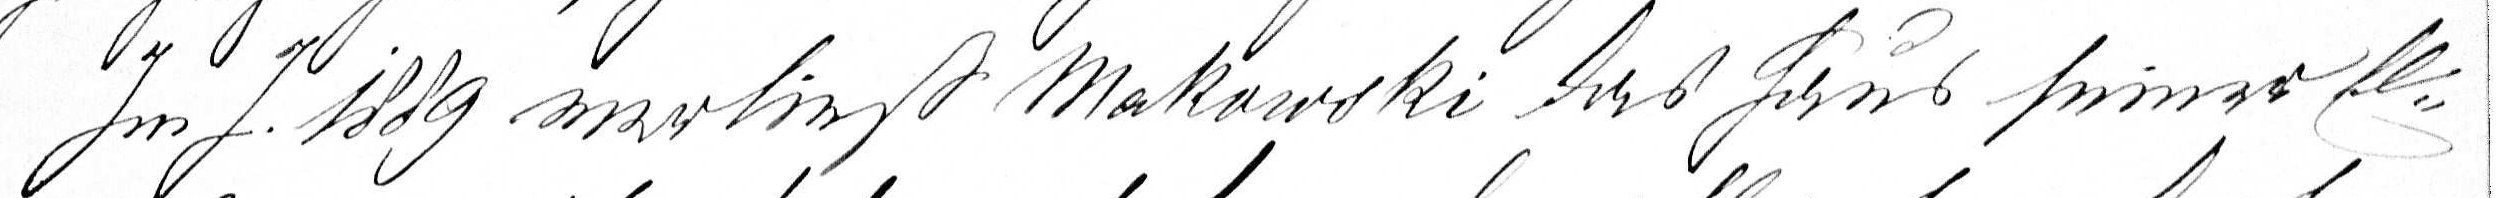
Im J. 1889 verließ Makowski das Haus seiner El¬
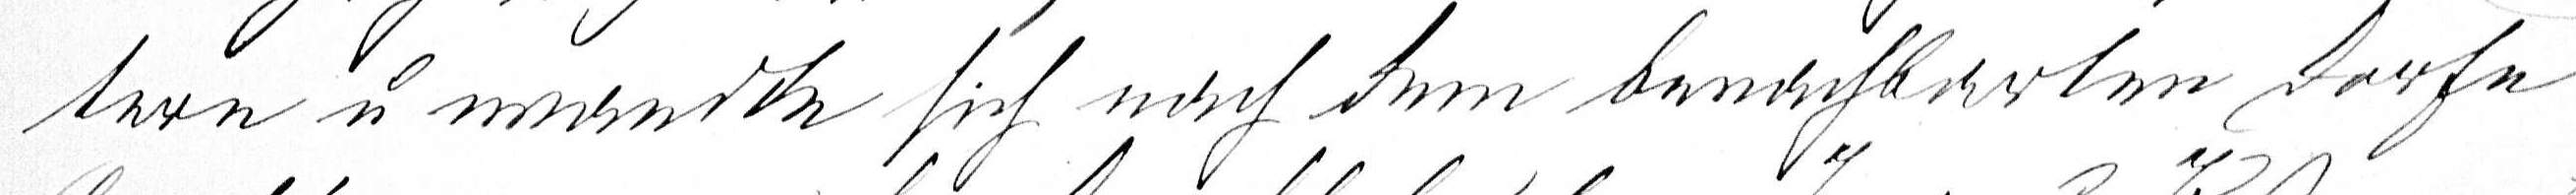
tern u. wandte sich nach dem benachbarten Hause
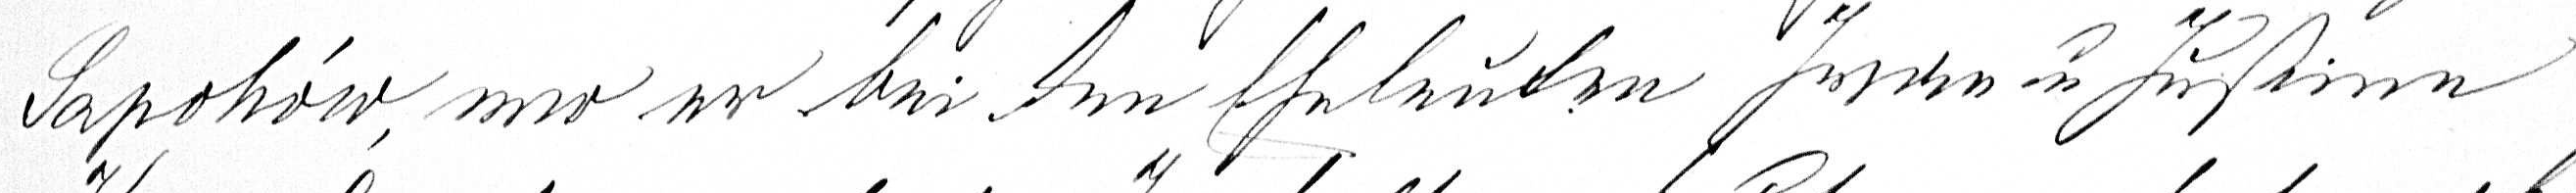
Sapohów, wo er bei den Eheleuten Iwan u. Justine
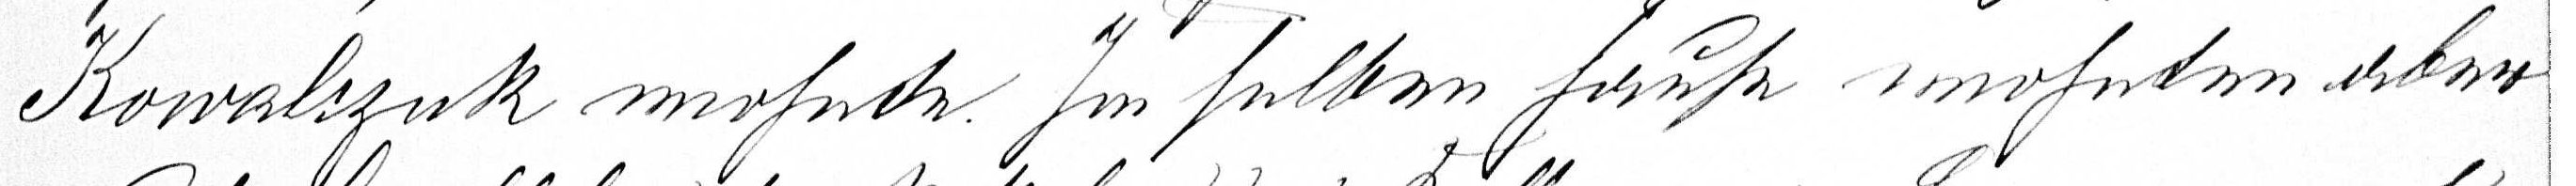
Kowalczuk wohnte. Im selben Hause wohnten aber
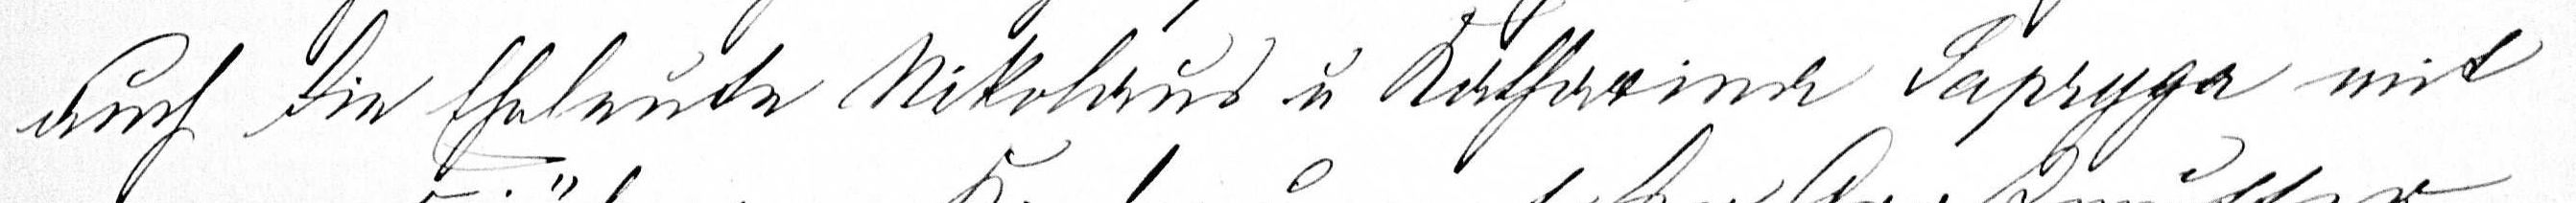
auch die Eheleute Nikolaus u. Katharina Sapryga mit
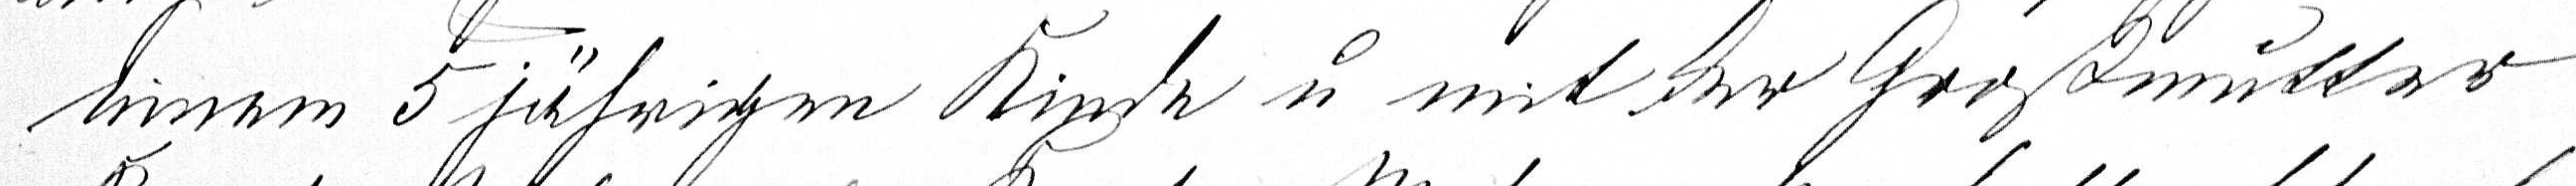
einem 5jährigen Kinde u mit der Großmutter
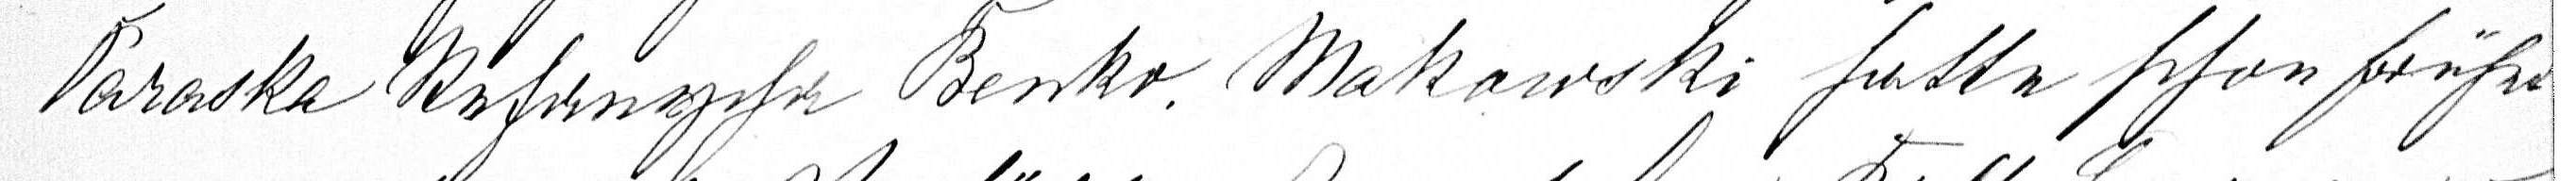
Paraska Stefanycha Benko. Makowski hatte schon früher
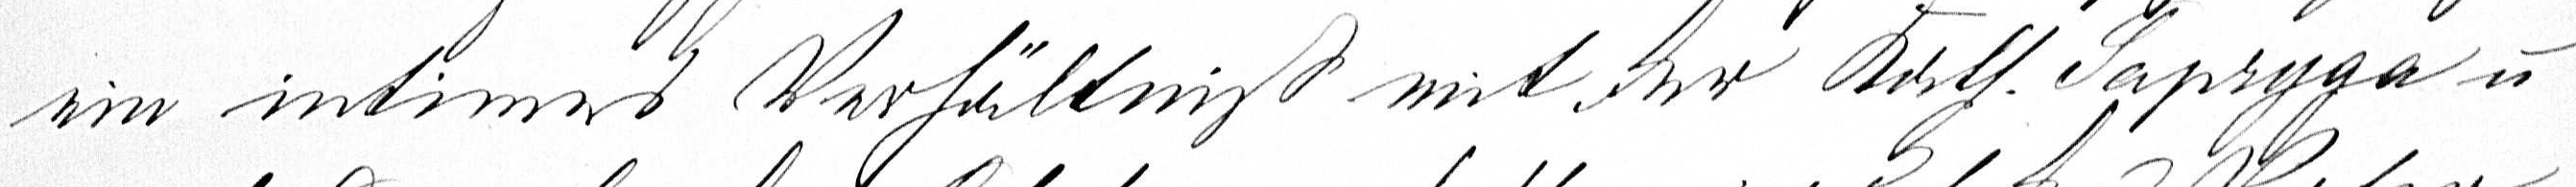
ein intimes Verhältniß mit der Kath. Sapryga u
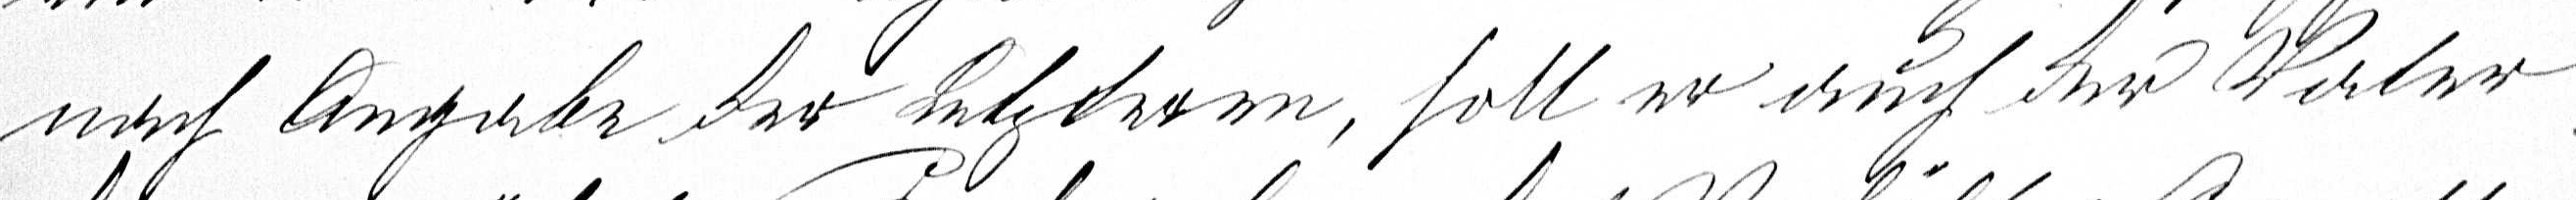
nach Angabe der letzteren, soll er auch der Vater
